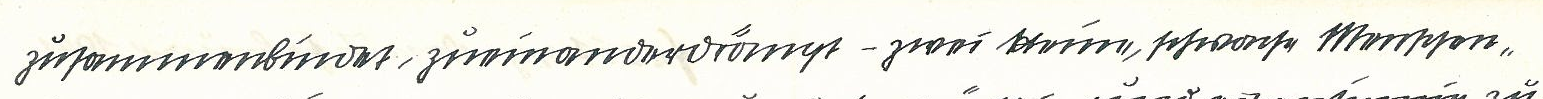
zusammenbindet, zueinanderdrängt – zwei kleine, schwache Menschen¬
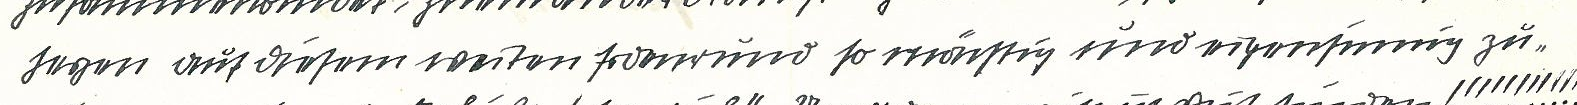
herzen auf diesem weiten Erdenrund so mächtig und eigensinnig zu¬
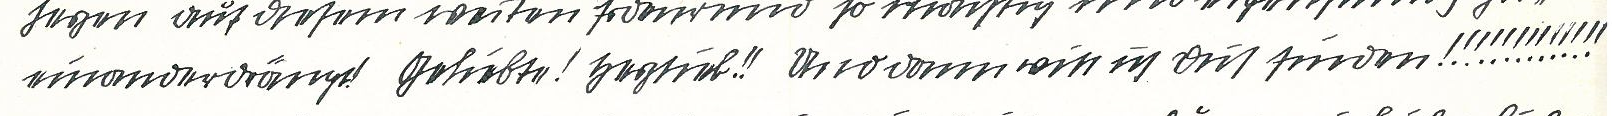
einander drängt! Geliebte! Herzlieb!! Und dann will ich Dich finden!!!!!!!!!!!!!
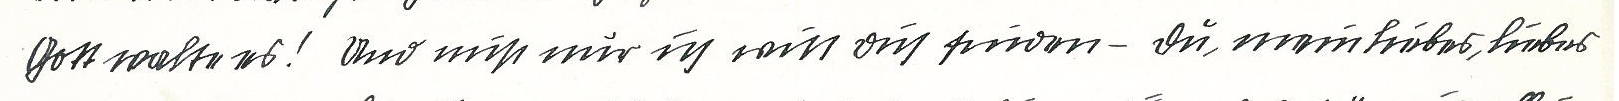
Gott walte es! Und nicht nur ich will Dich finden – Du, mein liebes, liebes
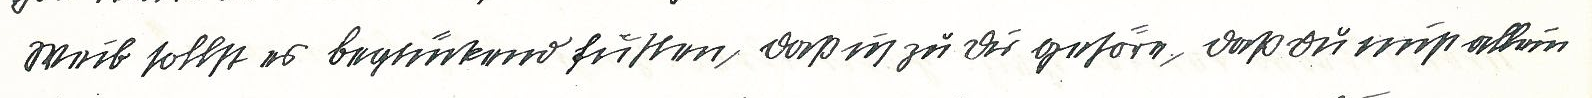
Weib sollst es beglückend fühlen, daß ich zu Dir gehöre, daß Du nicht allein
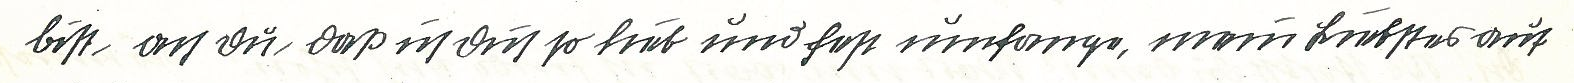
bist, ach Du, daß ich Dich so lieb und fest umfange, mein Liebstes auf
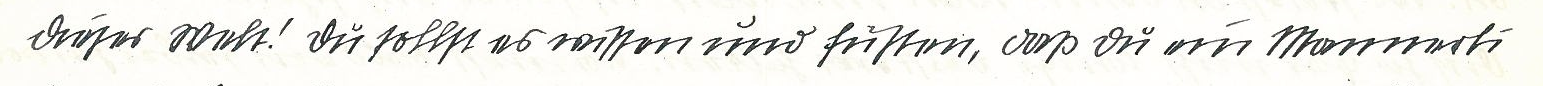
dieser Welt! Du sollst es wissen und fühlen, daß Du ein Mannerli
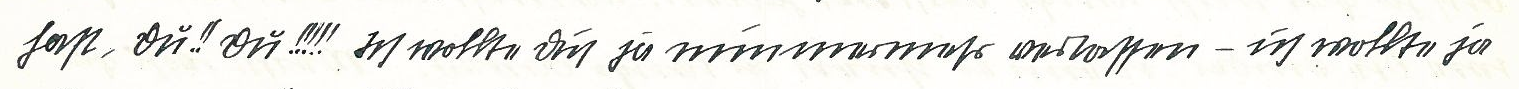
hast, Du!! Du!!!!! Ich wollte Dich ja nimmermehr verlassen – ich wollte ja
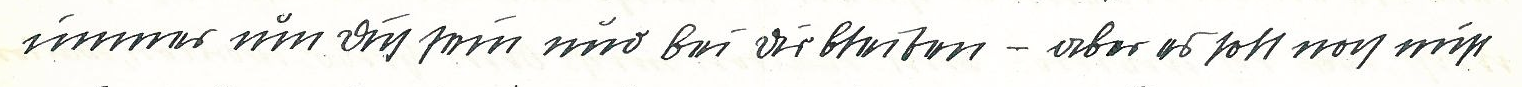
immer um Dich sein und bei Dir bleiben – aber es soll noch nicht
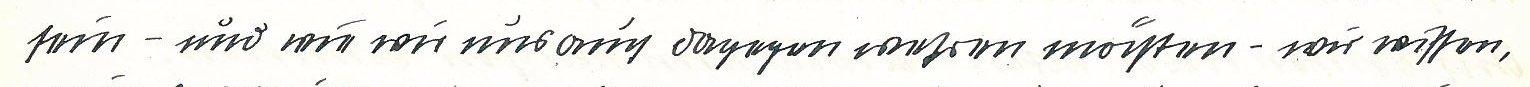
sein – und wie wir uns auch dagegen wehren möchten – wir wissen,
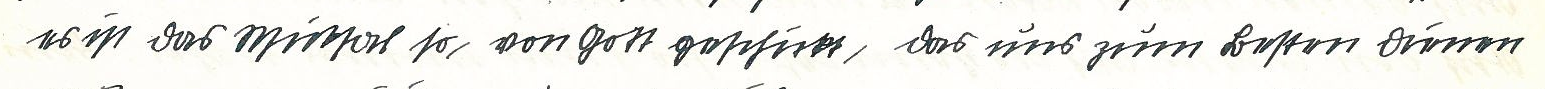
es ist das Schicksal so, von Gott geschickt, das uns zum Besten dienen
